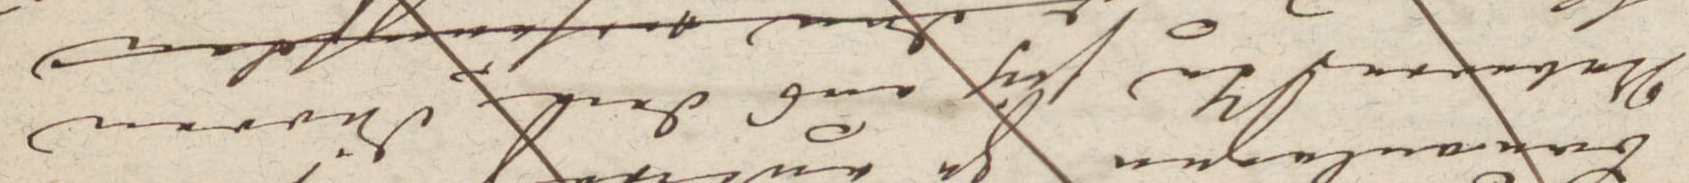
widerspruch seyn müsse dass er ihm schon jetzt,
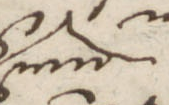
und er
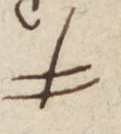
%
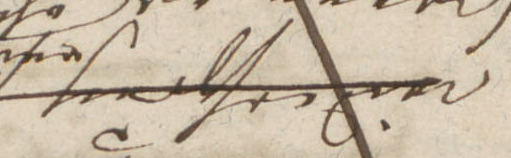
und den versumpften
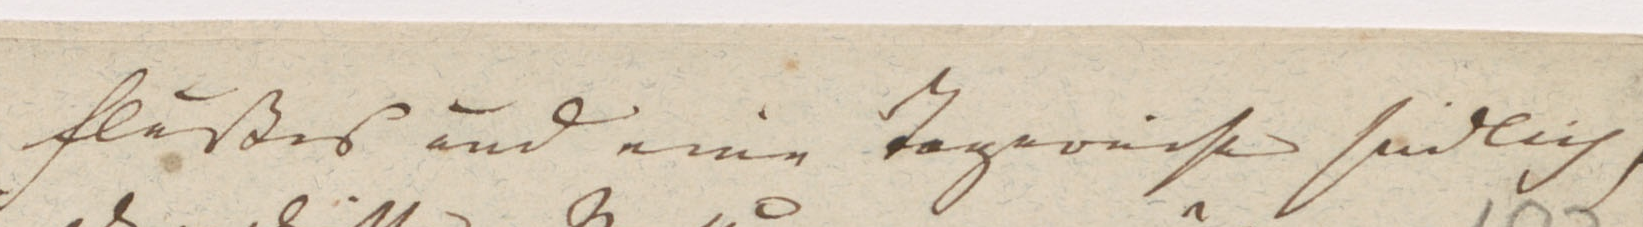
Flusses und eine Tagereise südlich,
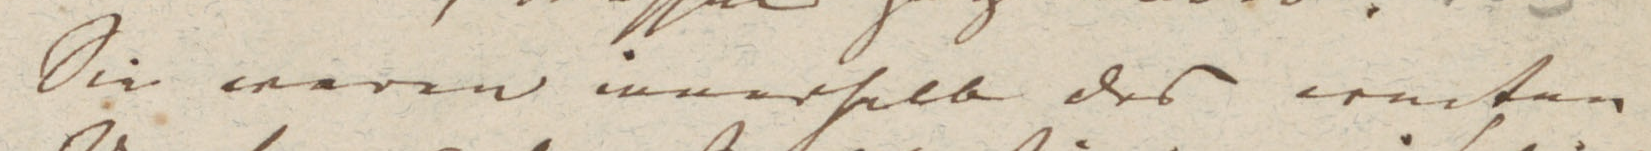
Sie waren innerhalb des weiten
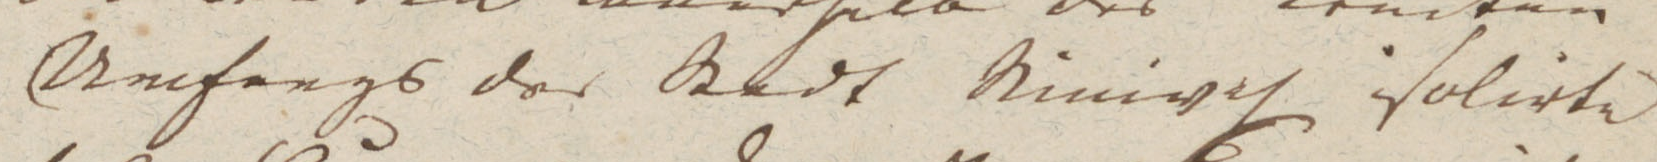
Umfangs der Stadt Niniveh isolirte
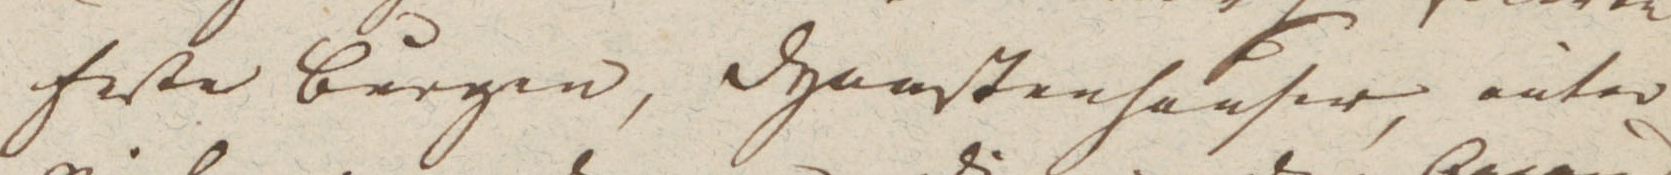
feste Burgen, Dynastenhäuser, unter
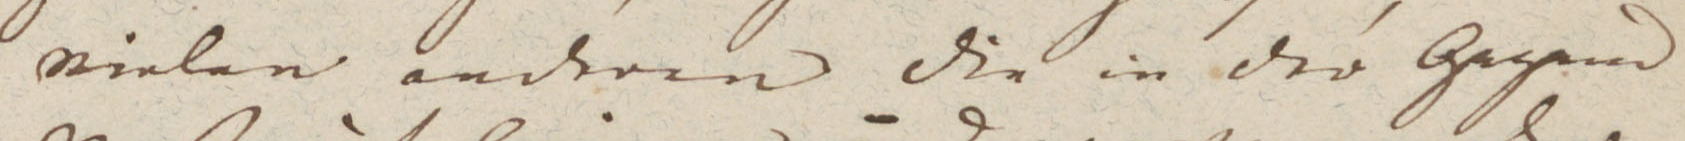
vielen anderen die in der Gegend
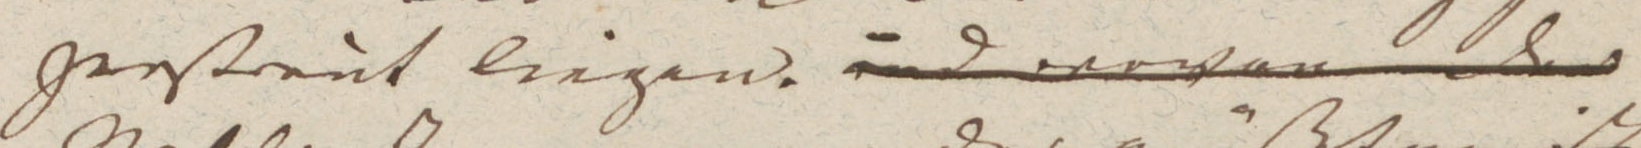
zerstreut liegen. und wovon der
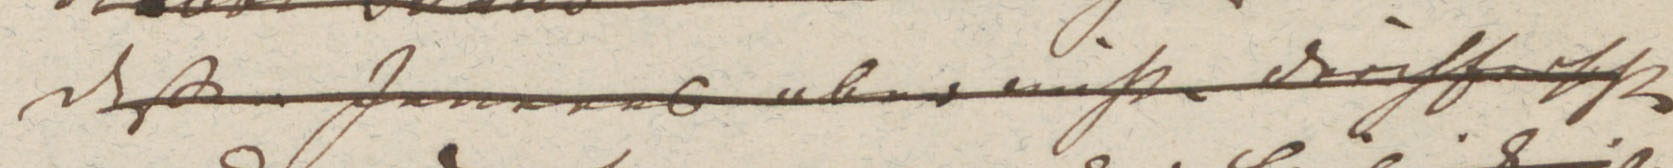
dessen Inneres aber nicht durchforscht
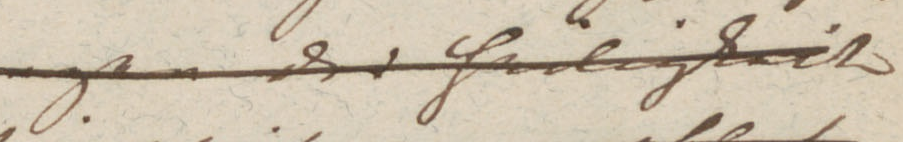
wegen der Heiligkeit
